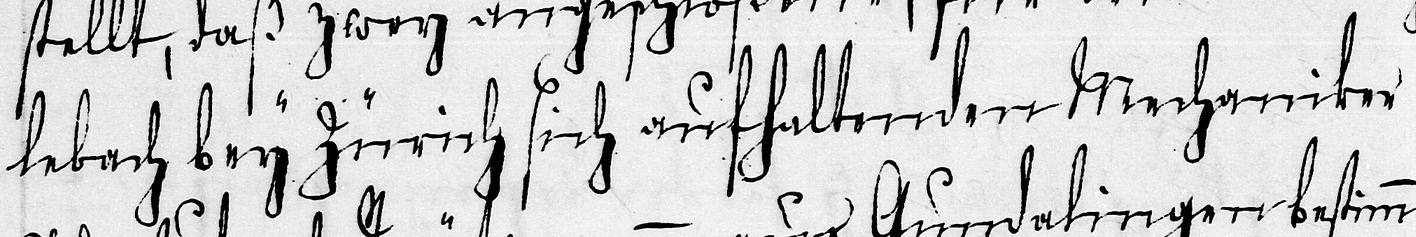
lebach bey Zürich sich aufhaltenden Mechaniker
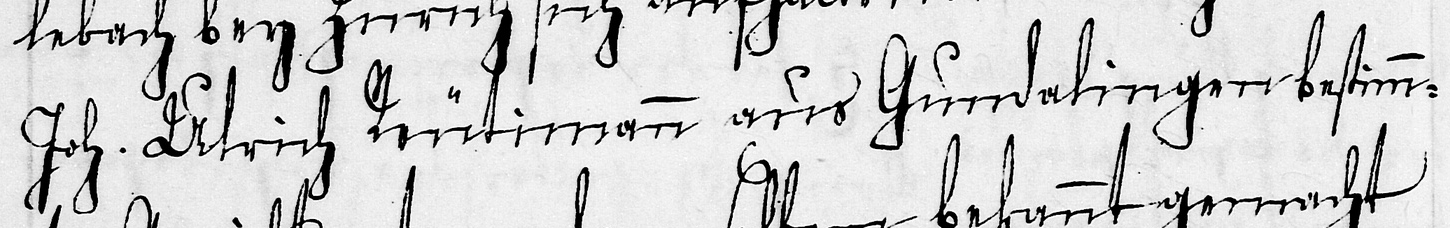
Joh. Ulrich Reutimann aus Gundalingen bestimm¬
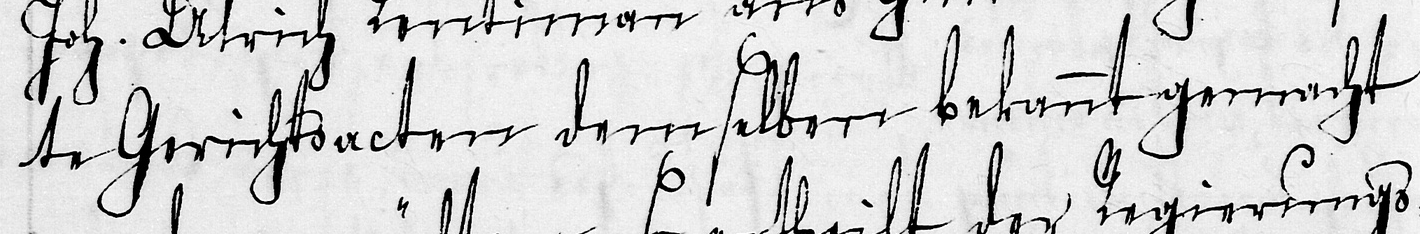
te Gerichtsacten demselben bekannt gemacht
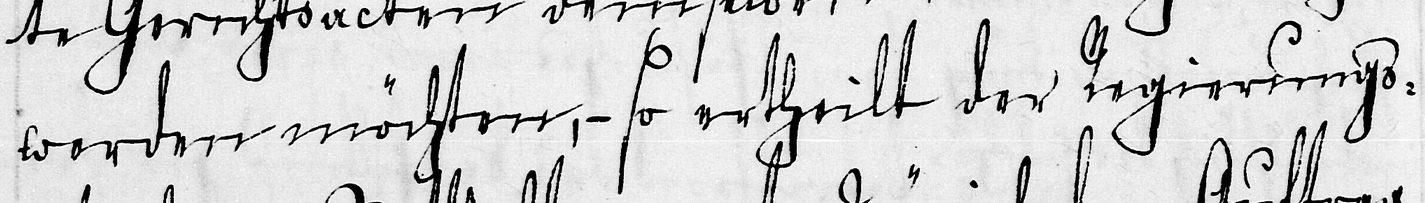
werden möchten, – so ertheilt der Regierungs¬
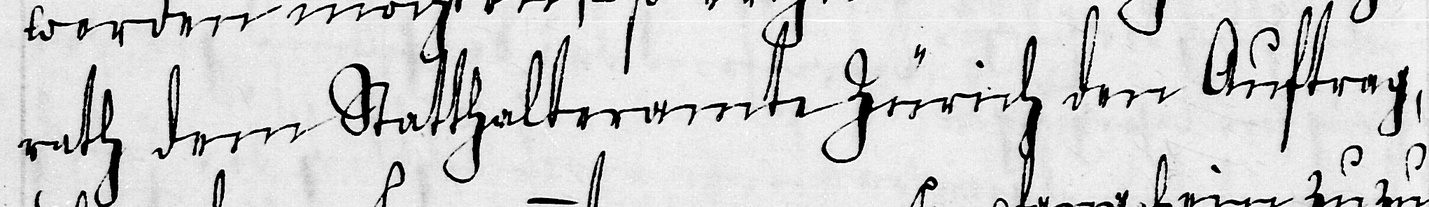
rath dem Statthalteramte Zürich den Auftrag,
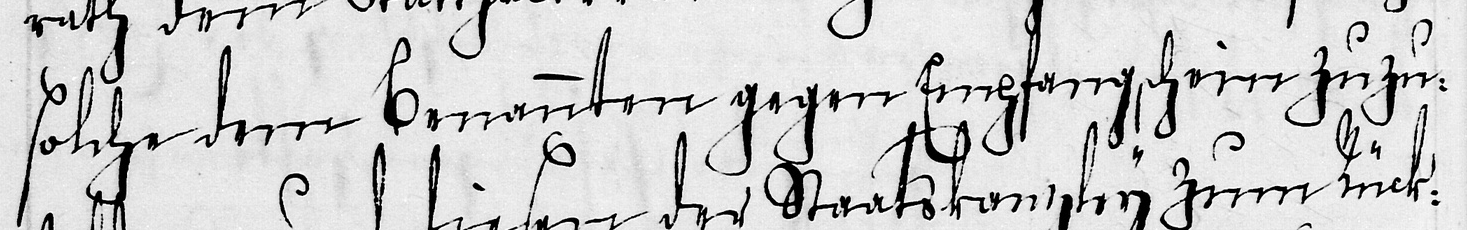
solche dem Benannten gegen Empfangschein zuzu¬
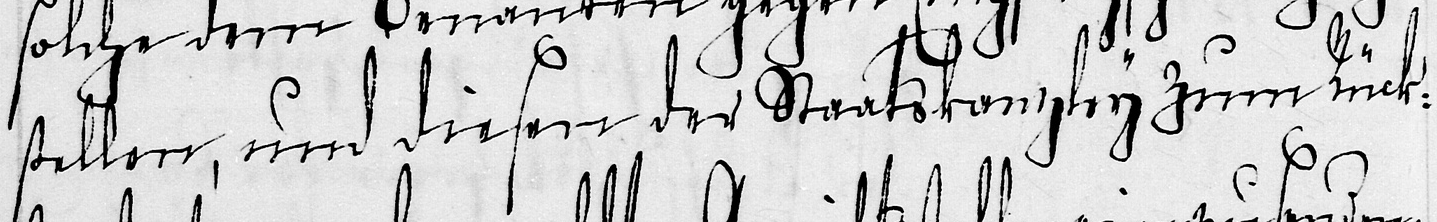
stellen, und diesen der Staatskanzley zum Rück¬
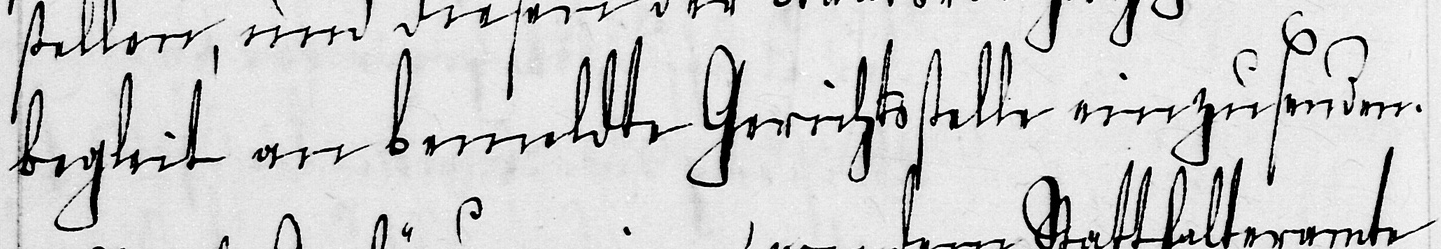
begleit an bemeldte Gerichtsstelle einzusende¬
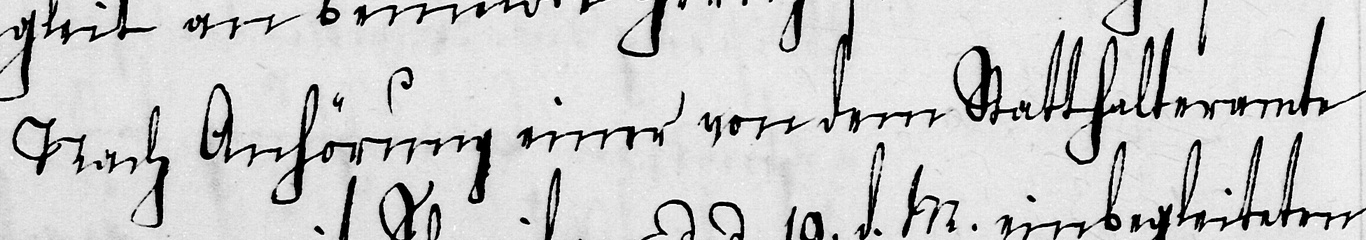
Nach Anhörung einer von dem Statthalteramte
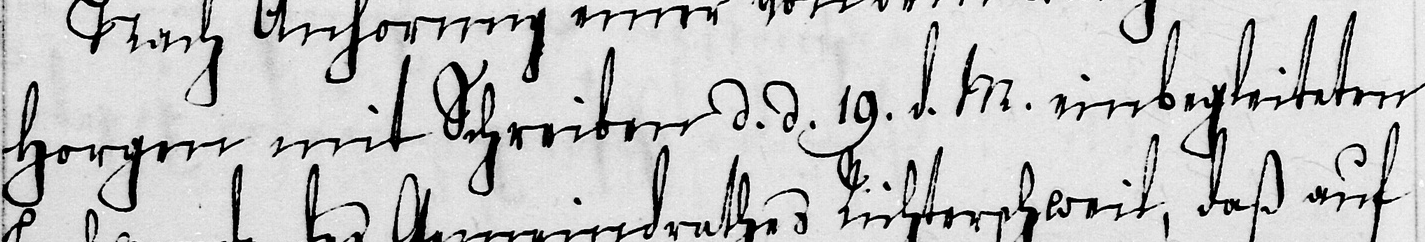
Horgen mir Schreiben d. d. 19. d. M. einbegleiteten
